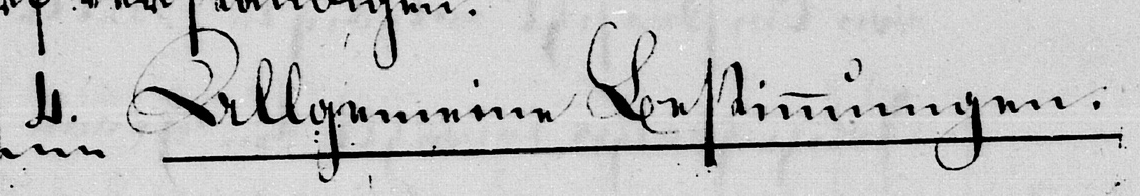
4. Allgemeine Bestimmungen.
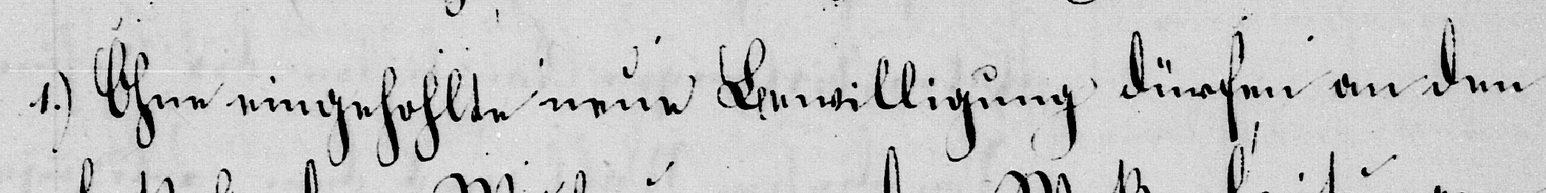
1.) Ohne eingehohlte neue Bewilligung dürfen an den
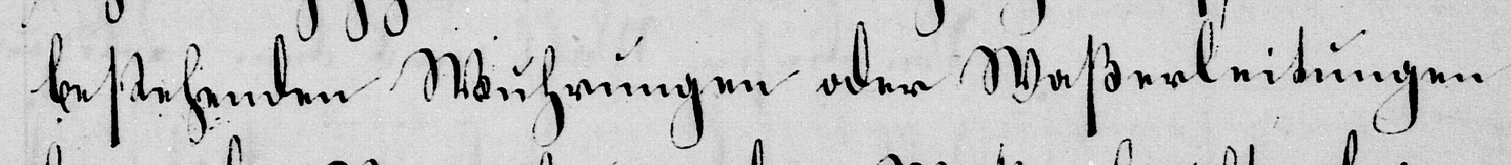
bestehenden Wuhrungen oder Waßerleitungen
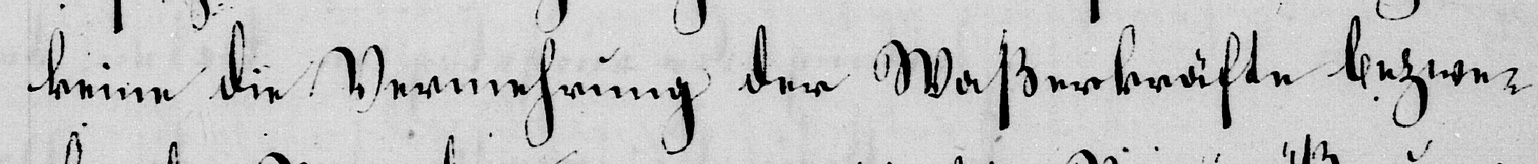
keine die Vermehrung der Waßerkraft bezwe¬
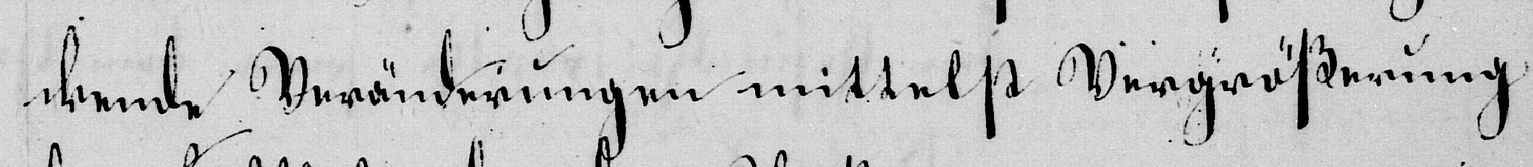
ckende Veränderungen mittelst Vergrößerung
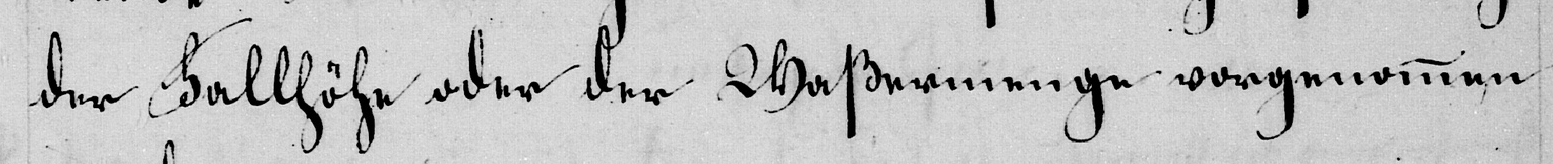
der Fallhöhe oder der Waßermenge vorgenommen
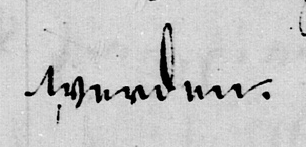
werden.
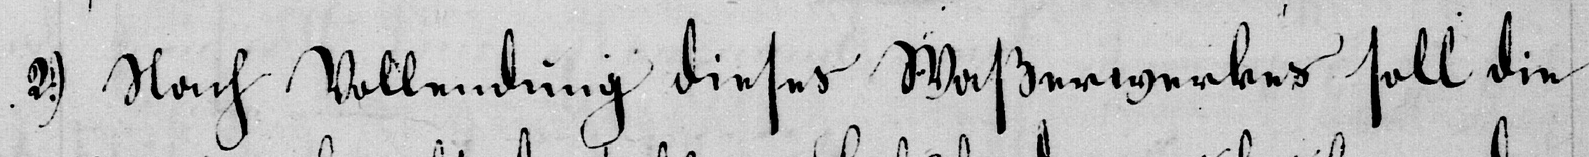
2.) Nach Vollendung dieses Waßerwerkes soll die
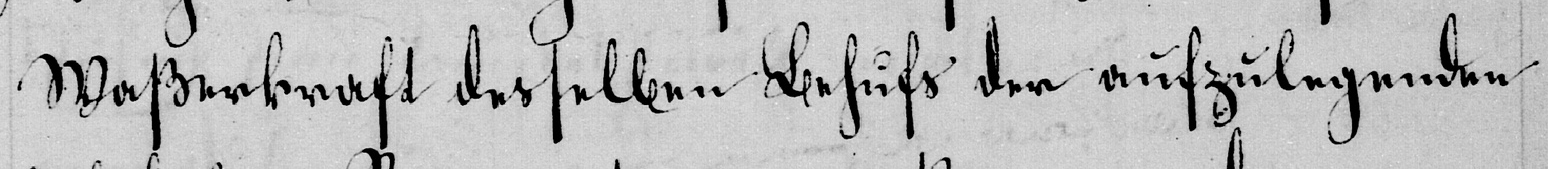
Waßerkraft desselben Behufs der aufzulegenden
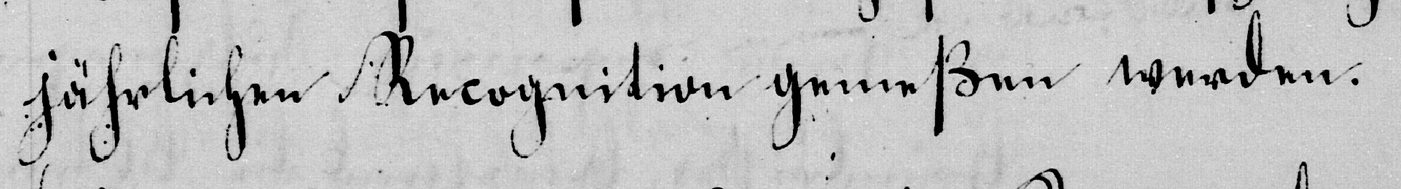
jährlichen Recognition gemeßen werden.
